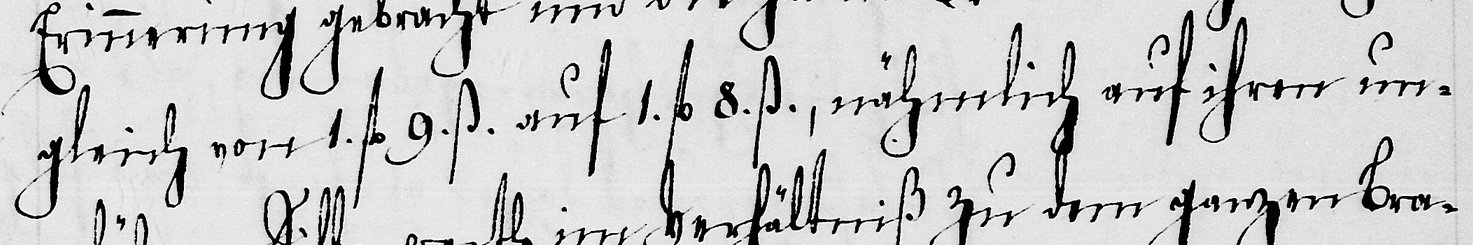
gleich von 1. fl. 9. ß. auf 1. fl. 8. ß., nähmlich auf ihren un¬
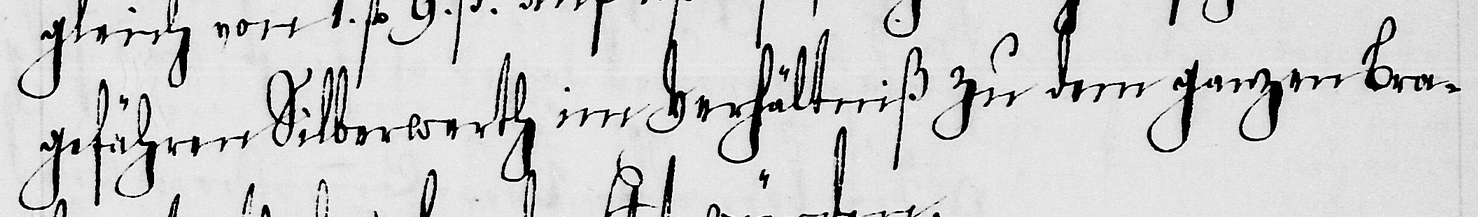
gefähren Silberwerth im Verhältniß zu dem ganzen Bra¬
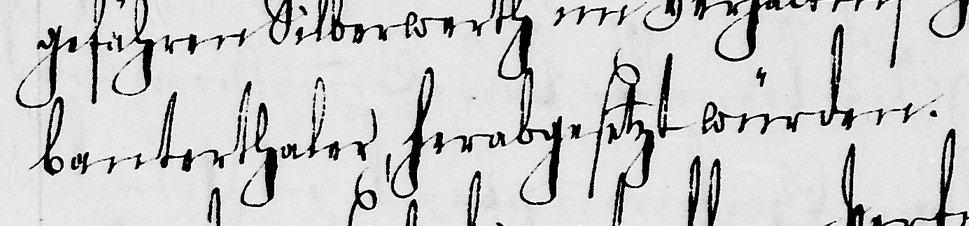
banterthaler, herabgesetzt würden.
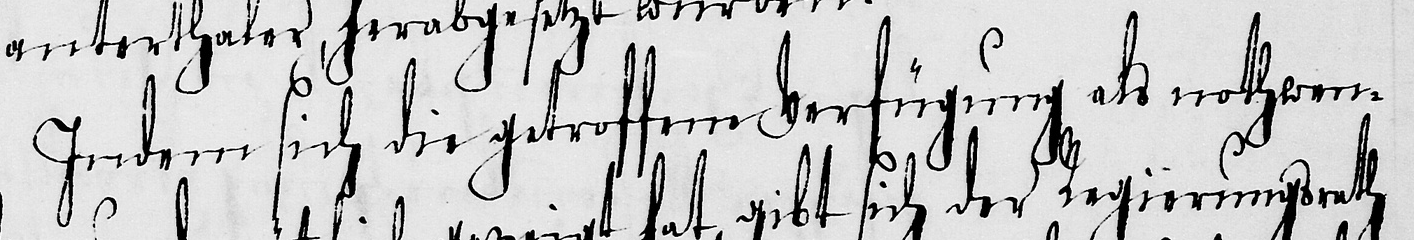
Indem sich die getroffene Verfügung als nothwe¬
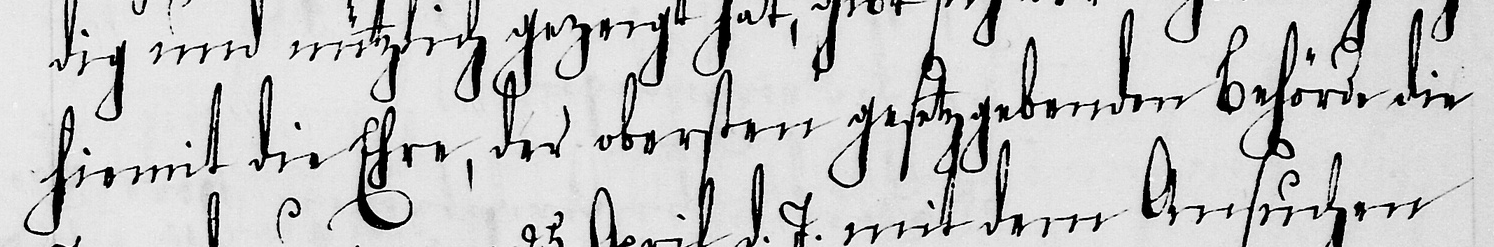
hiermit die Ehre, der obersten gesetzgebenden Behörde die
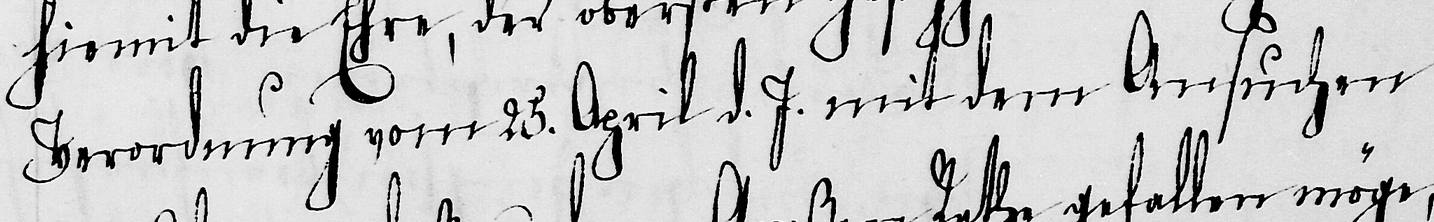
Verordnung vom 25. April d. J. mit dem Ansuchen
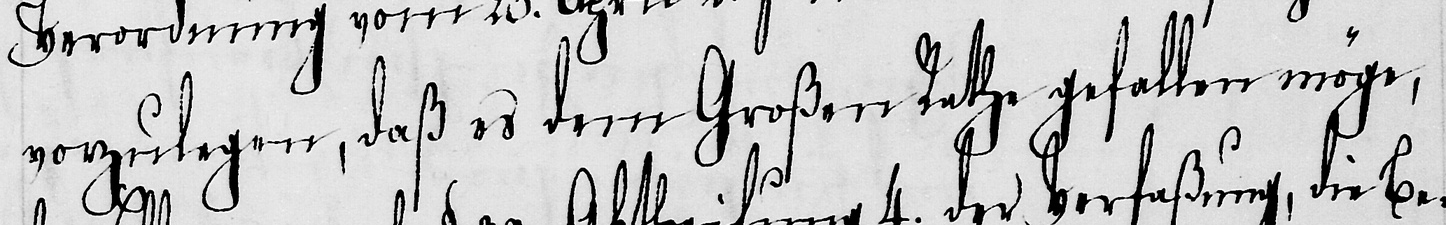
vorzulegen, daß es dem Großen Rathe gefallen möge,
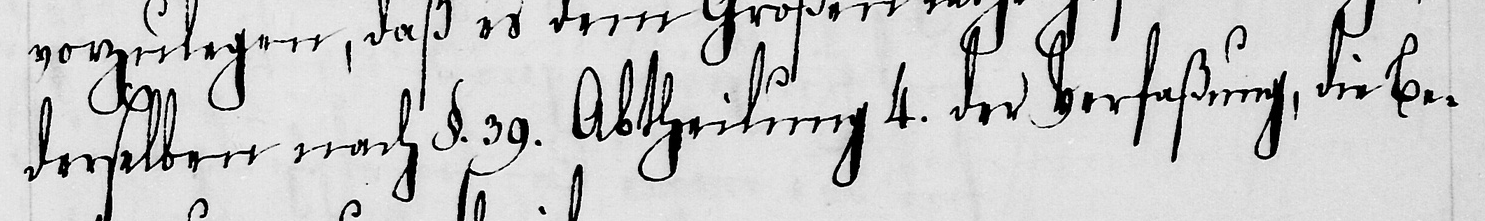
derselben nach §.39. Abtheilung 4. der Verfaßung, die Be¬
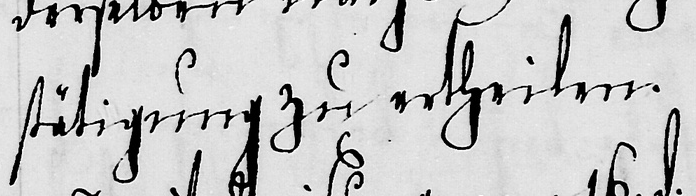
stätigung zu ertheilen.
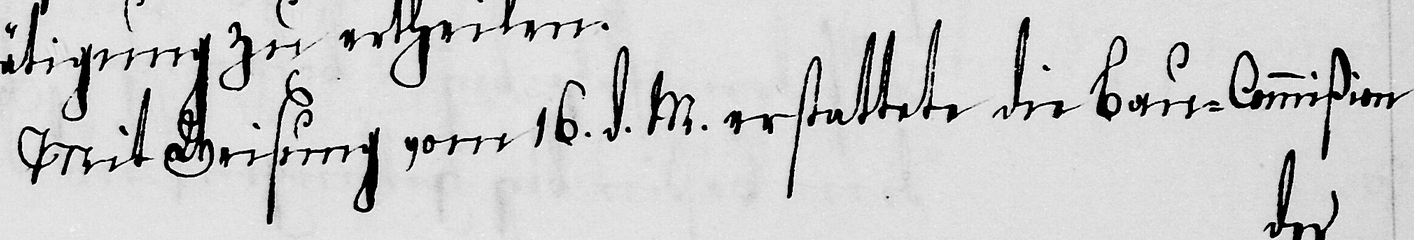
Mit Weisung vom 16. d. M. erstattete die Bau-Commißion
